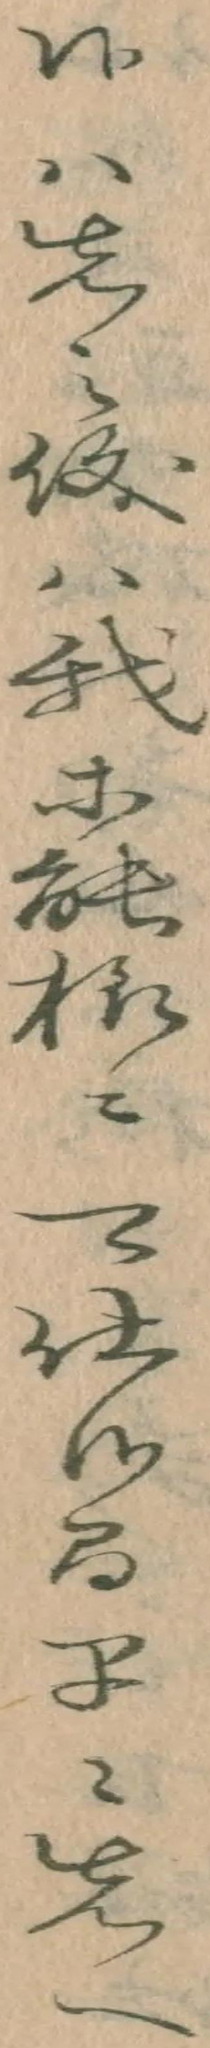候は先之儀は我等能様に可仕候間早々先へ
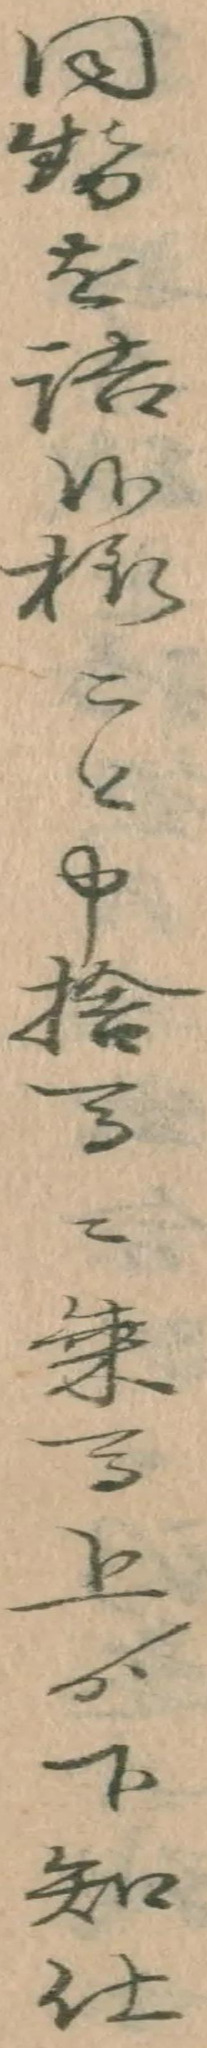同勢を詰候様にと申捨馬に乗馬上ゟ下知仕
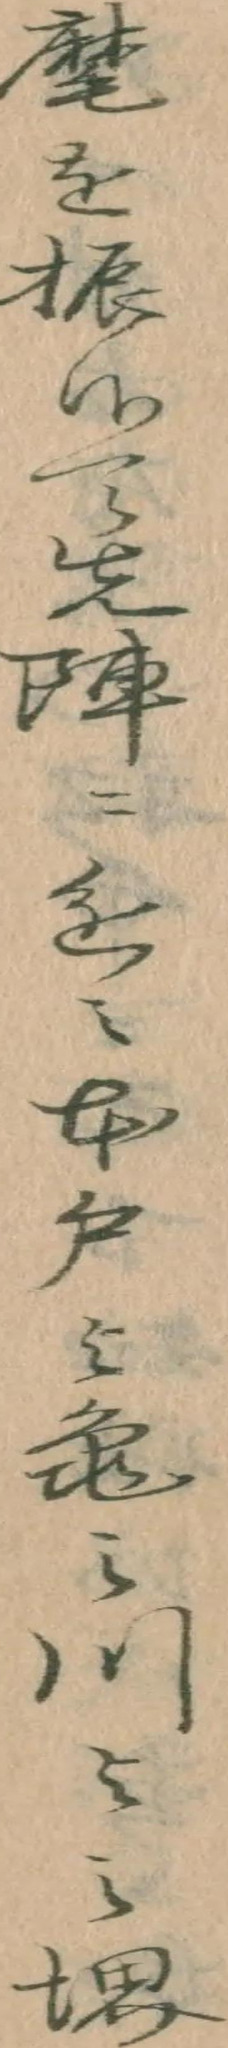麾を振候て先陣に進み本戸与亀之川与之堺
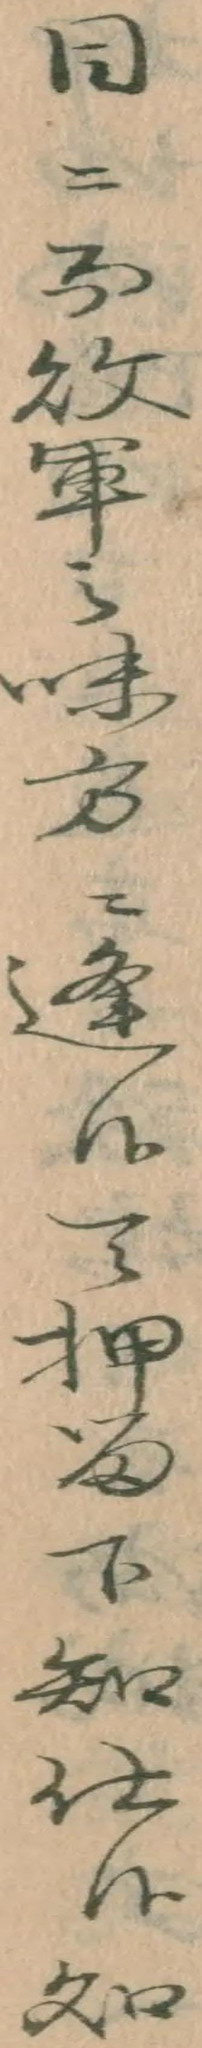目に而敗軍之味方に逢候て押留下知仕候処
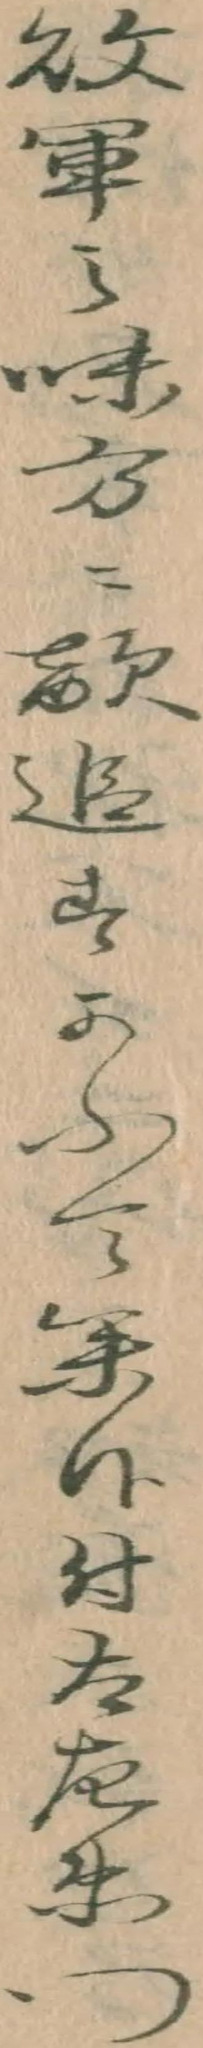敗軍之味方に敵追春かふて参候付太左衛門
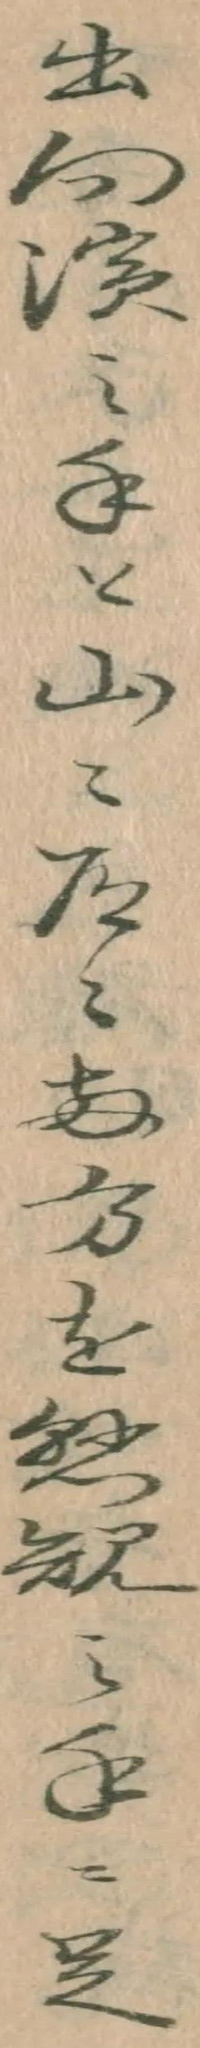出向浜之手と山々道々両方を懸観之手に足
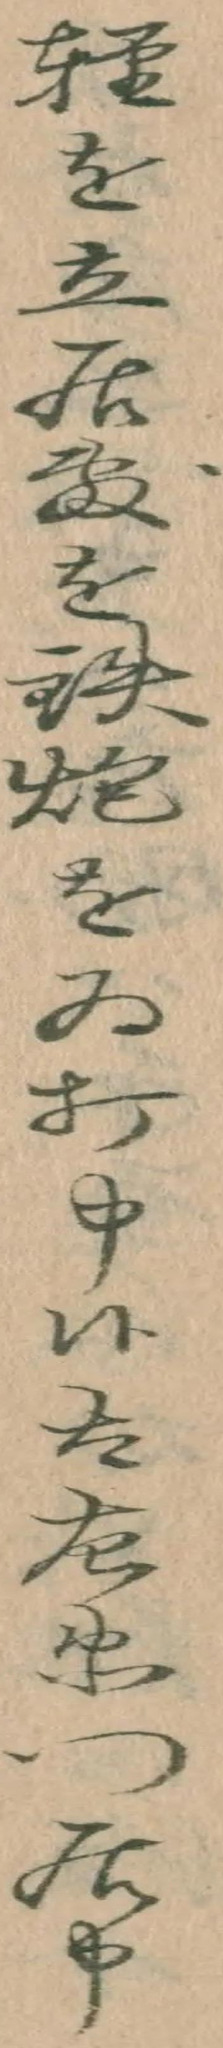軽を立居處を鉄炮をゐ打申候太左衛門居申
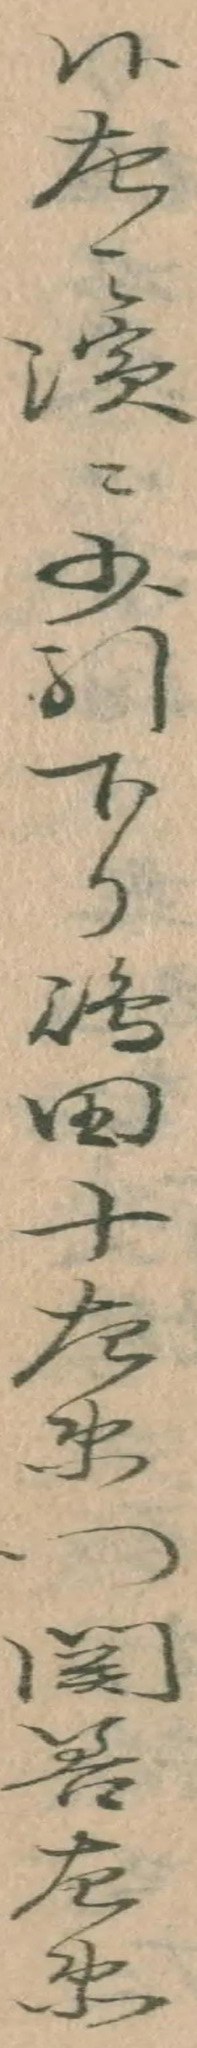候左之浜に少引下り島田十左衛門関善左衛
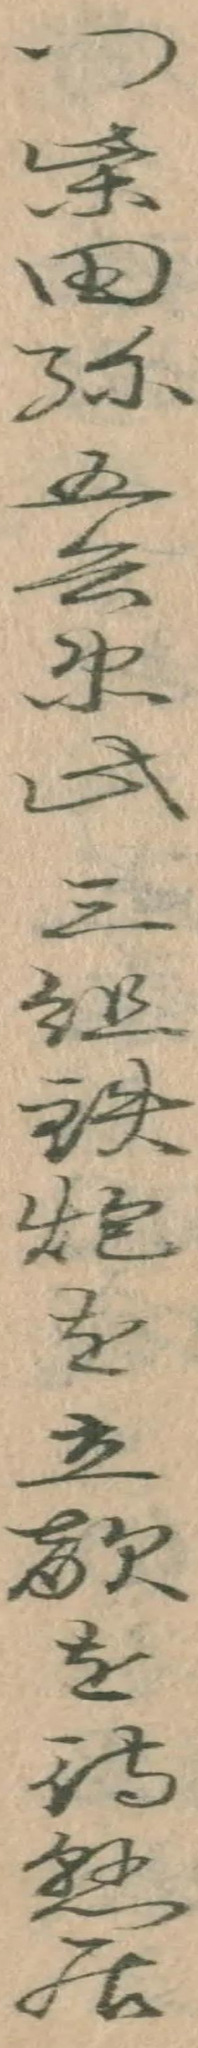門柴田弥五兵衛此三組鉄炮を立敵を待懸居
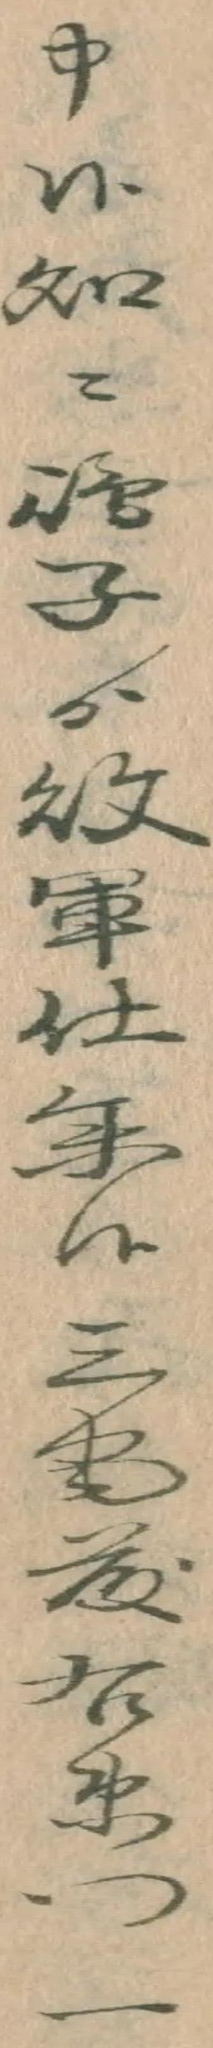申候処に島子ゟ敗軍仕参候三宅藤右衛門一
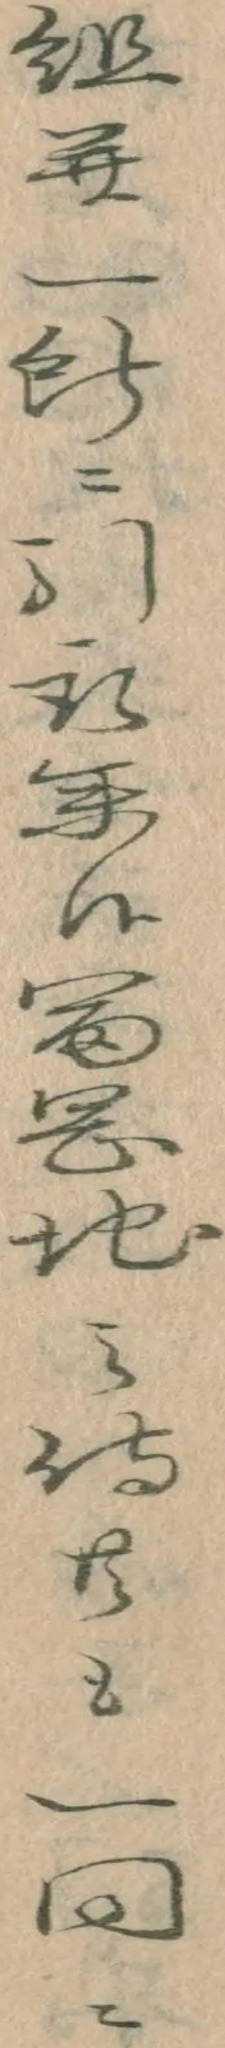組幷一所に引取参候冨岡地之侍共も一同に
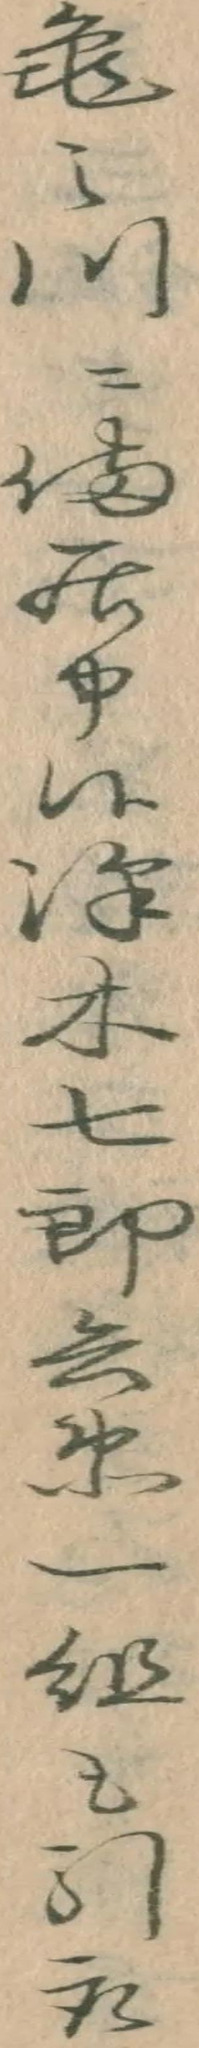亀之川に備居申候沢木七郎兵衛一組も引取
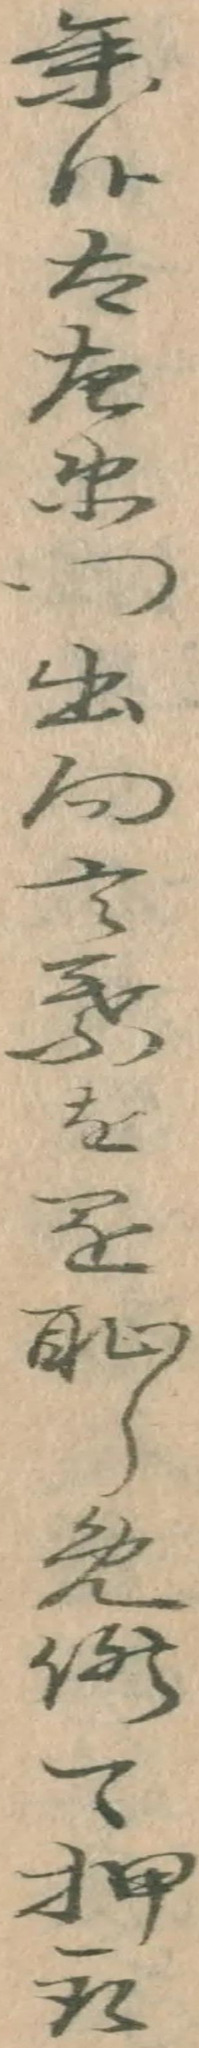参候太左衛門出向言葉を懸恥し免候て押取
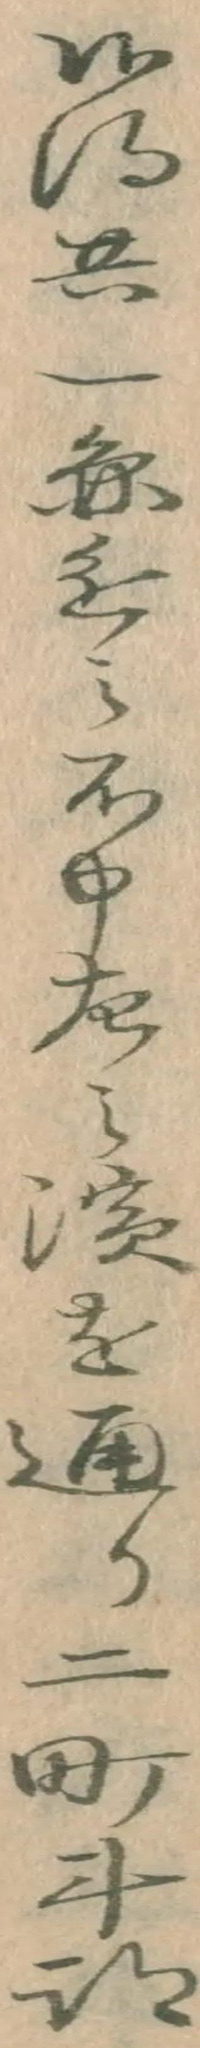候得共一円進み不申左之浜を通り二町斗跡

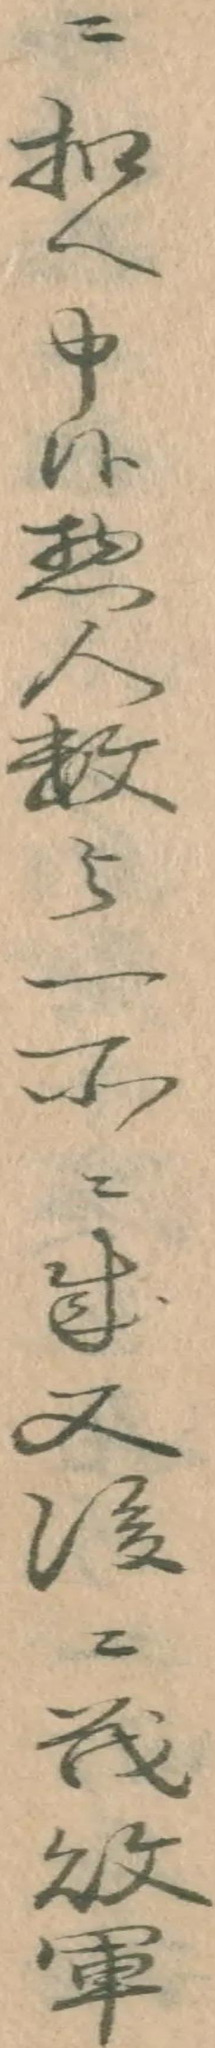に扣へ申候惣人数与一所に成又後に茂敗軍
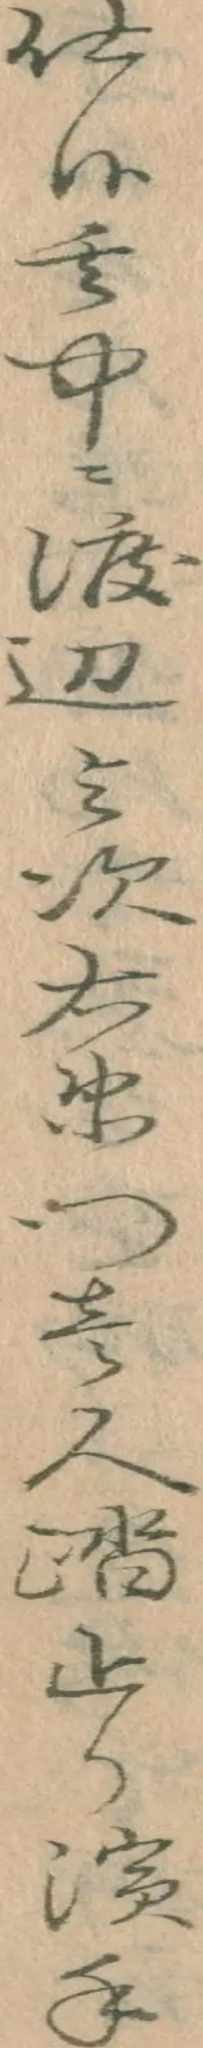仕候其中に渡辺与次右衛門壱人踏止り浜手
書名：切支丹御退治記 49巻. [2]
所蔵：国立国会図書館 National Diet Library, JAPAN
